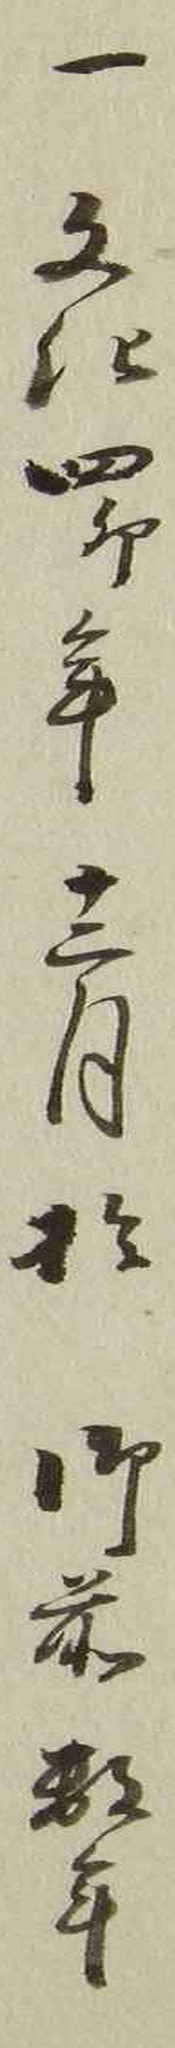一文化四卯年十二月於御数数年
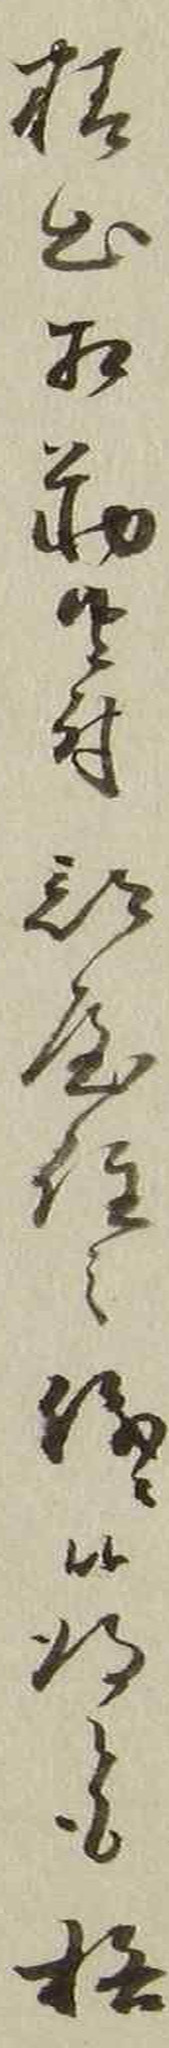精出相勤候に付部屋住之儀に候得とも格
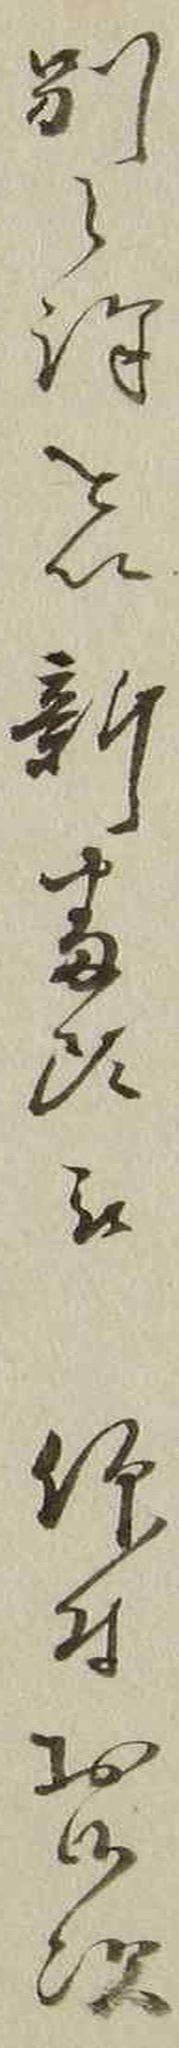別之譯を以新番頭被仰付於御次
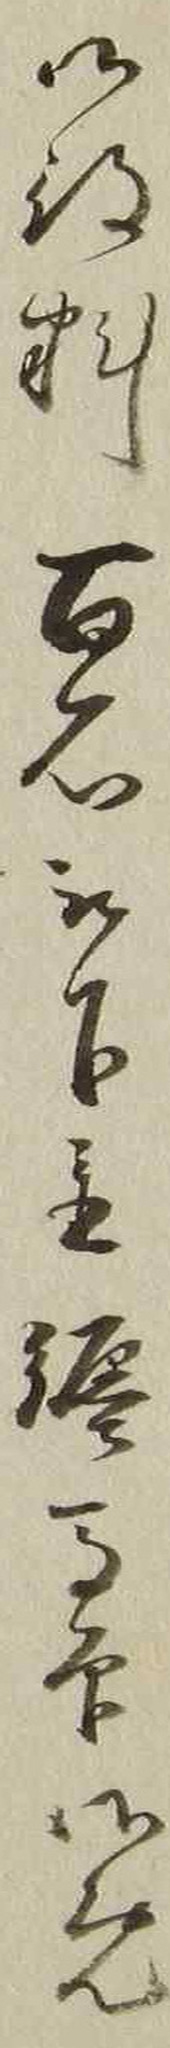御役料百石被下置纏馬印御免
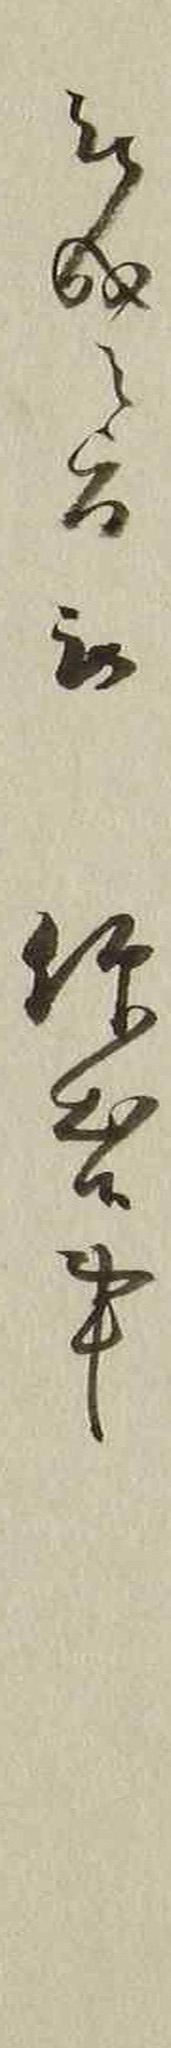被成之旨被仰出候事
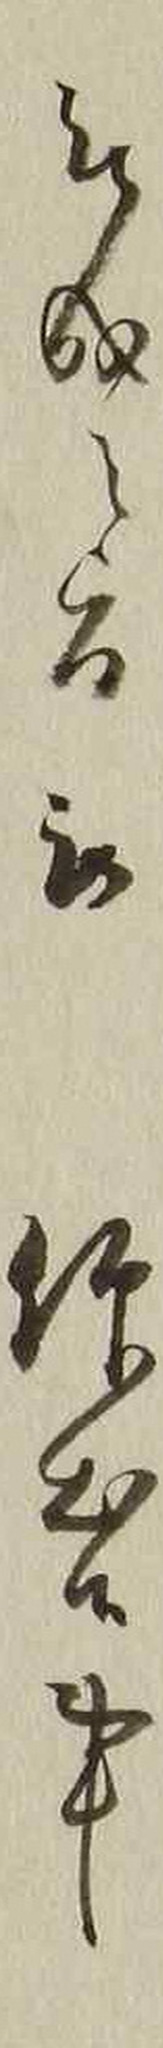被成之旨被仰出候事
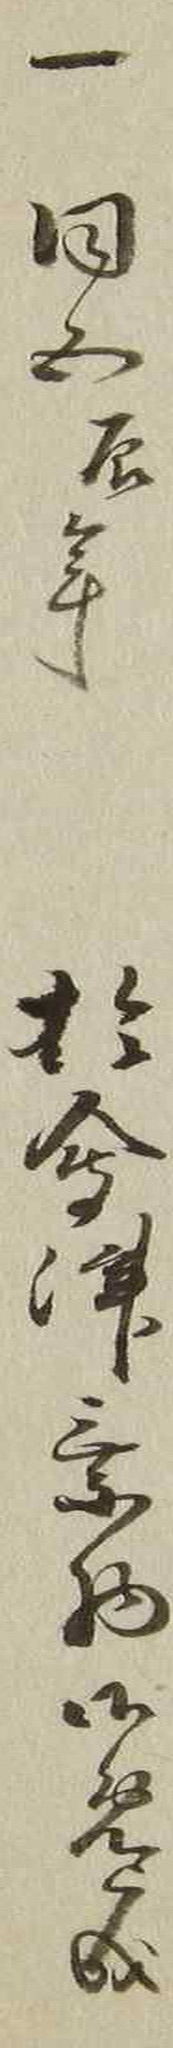一同五辰年於会津乗物御免被成
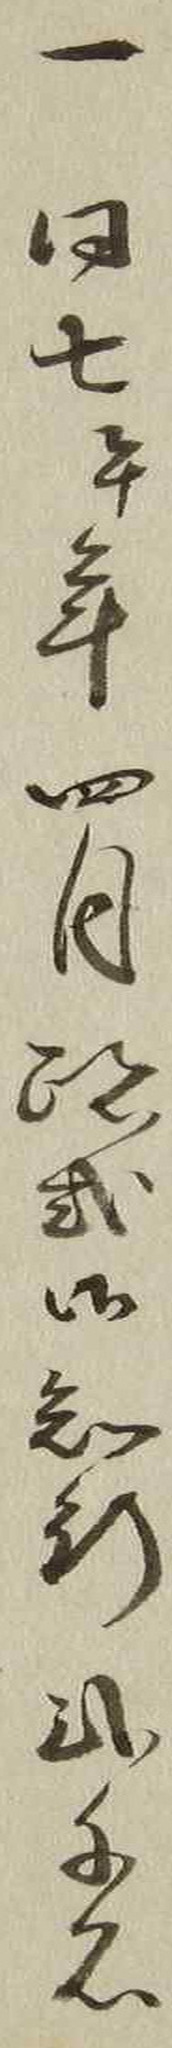一同七午年四付跡式御知行弐千石
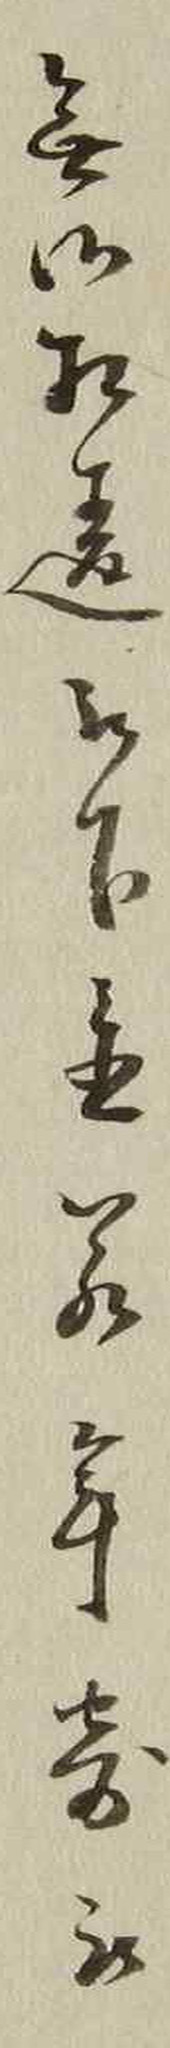無御相違被下置若年寄被
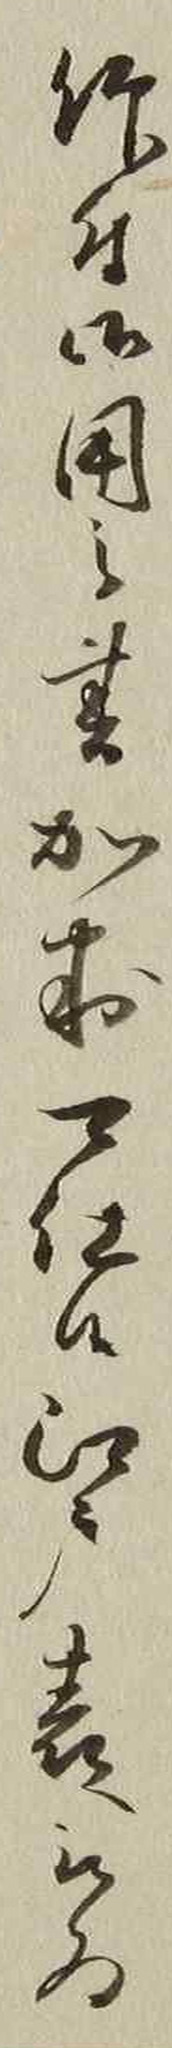仰付御用之書加判可仕候江戸表へ被為
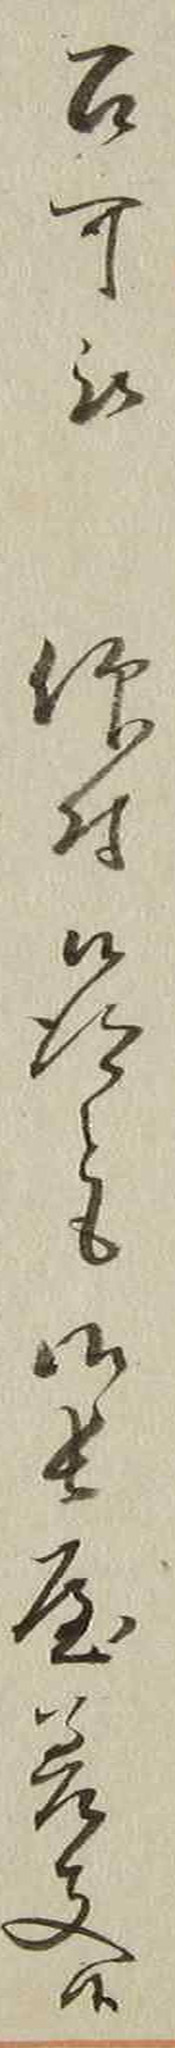召可被仰付候得とも御長屋差支候
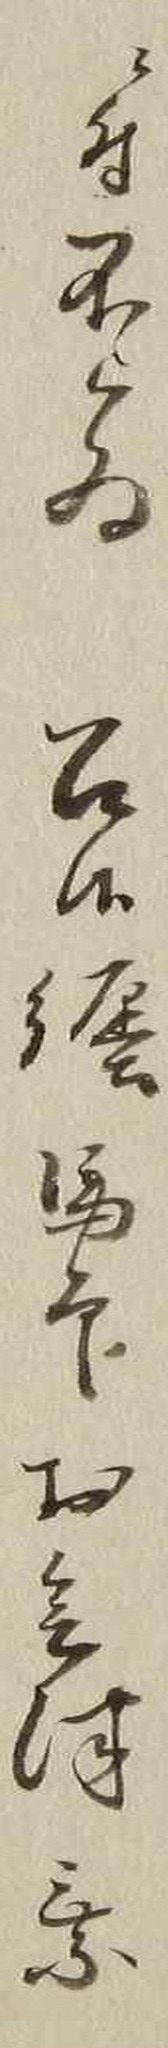に付不被為召候纏馬印於会津乗
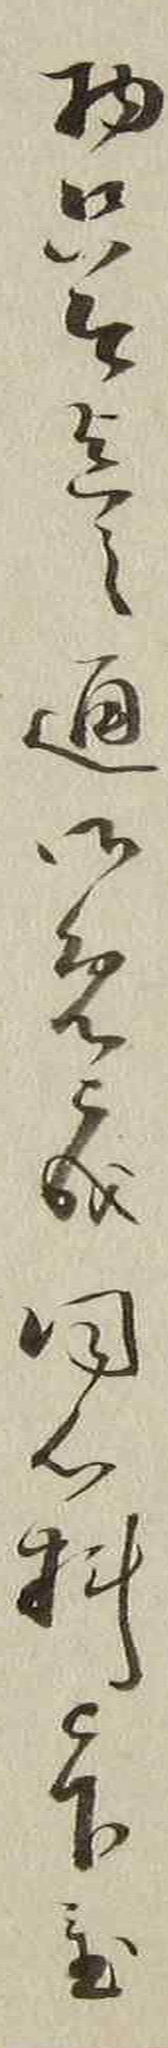物只今迄之通御免被成同心料被下置
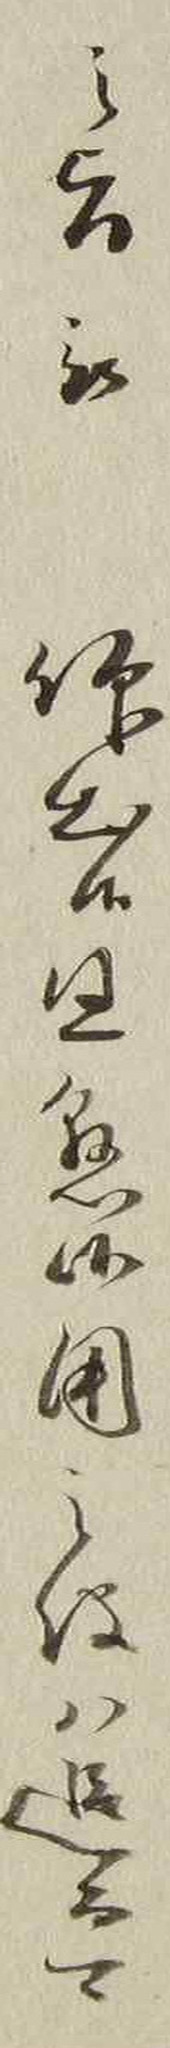之旨被仰出候旦懸御用之儀は追而可
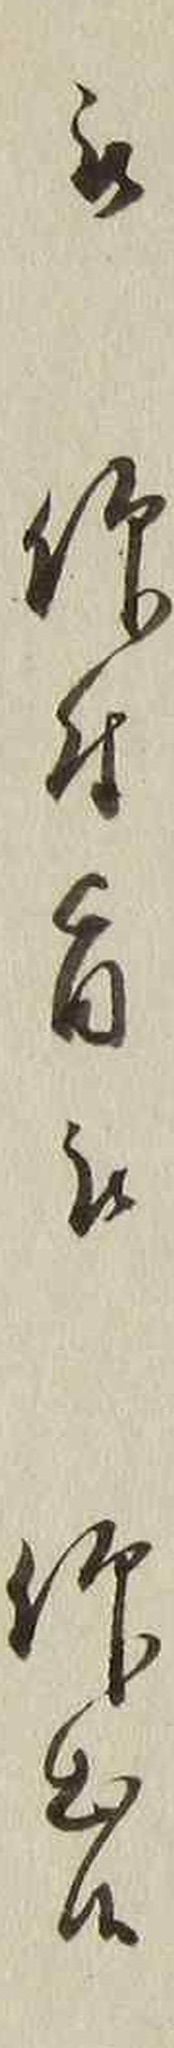被仰付旨被仰出候
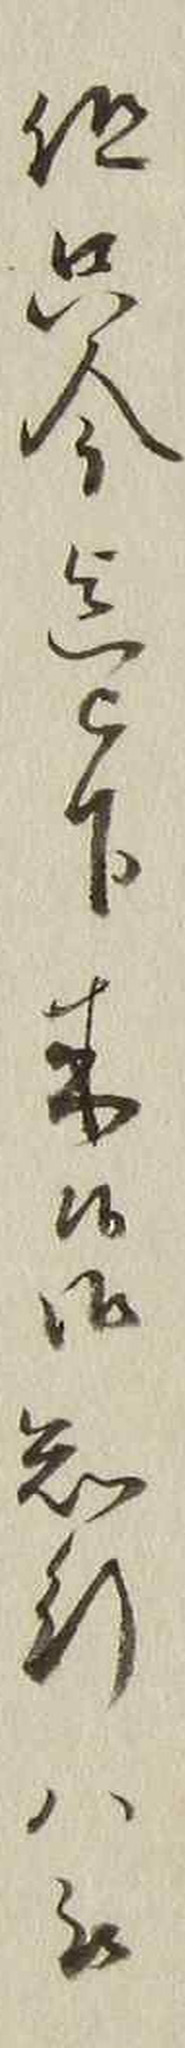但只今迄被下来候御知行は被
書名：諸士系譜　巻之159　な之部1
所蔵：会津若松市立会津図書館
